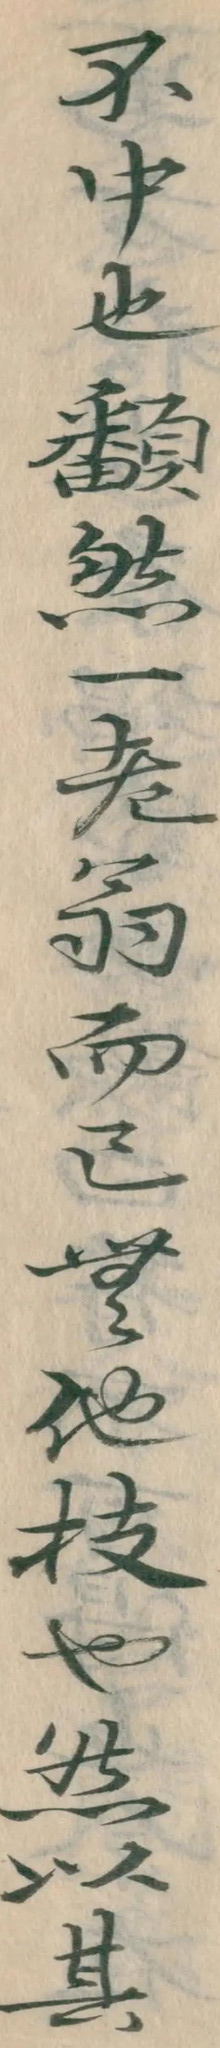不中也然一老翁而已無他技也然以其
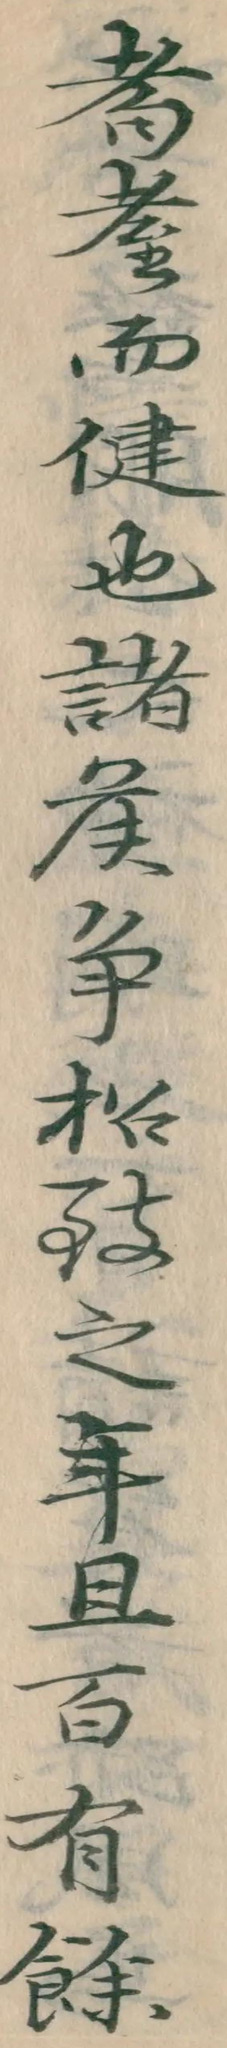耇耊而健也諸侯争招致之年且百有余
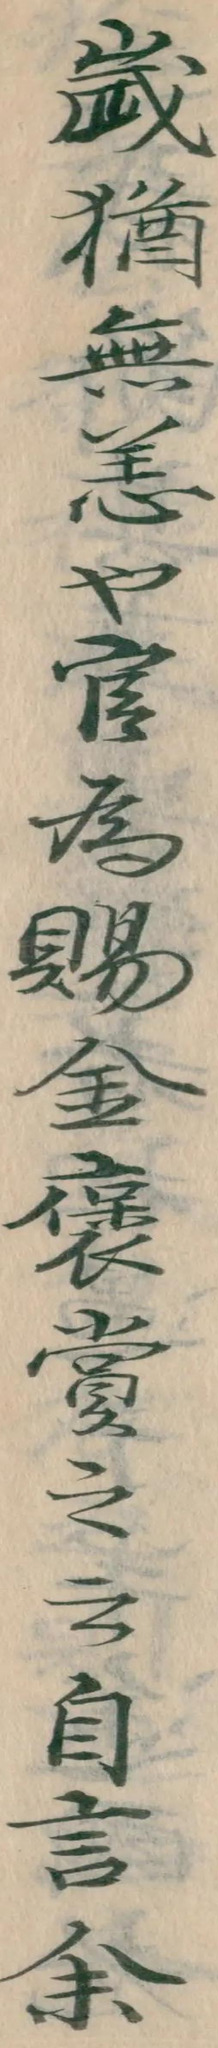歳猶無恙也為賜金褒賞云云自言余
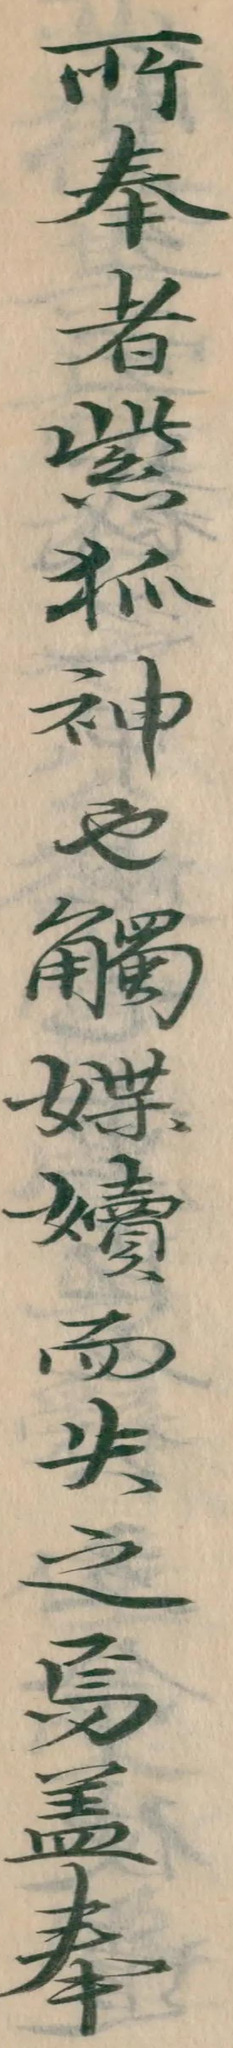所奉者紫狐神也触媟嬻而失之焉蓋奉
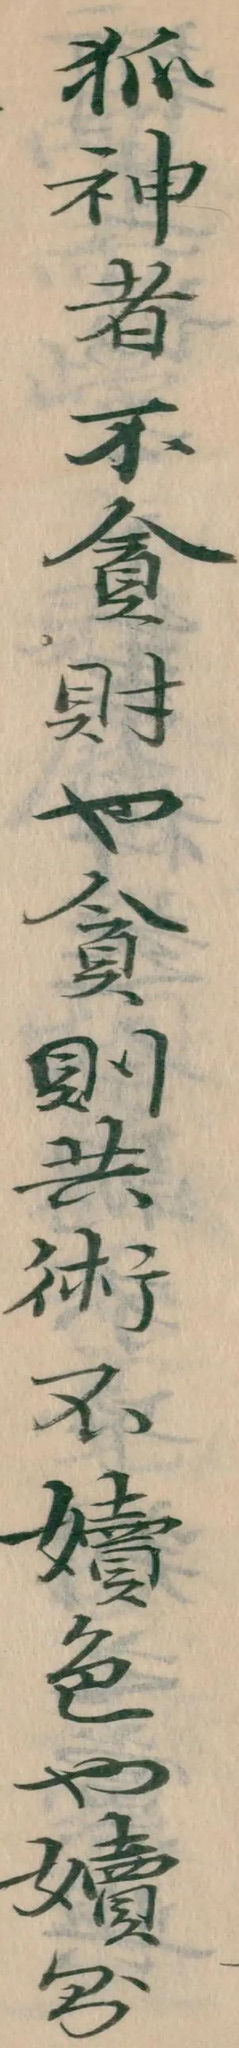狐神者不貪財也貪則共術不嬻色也嬻
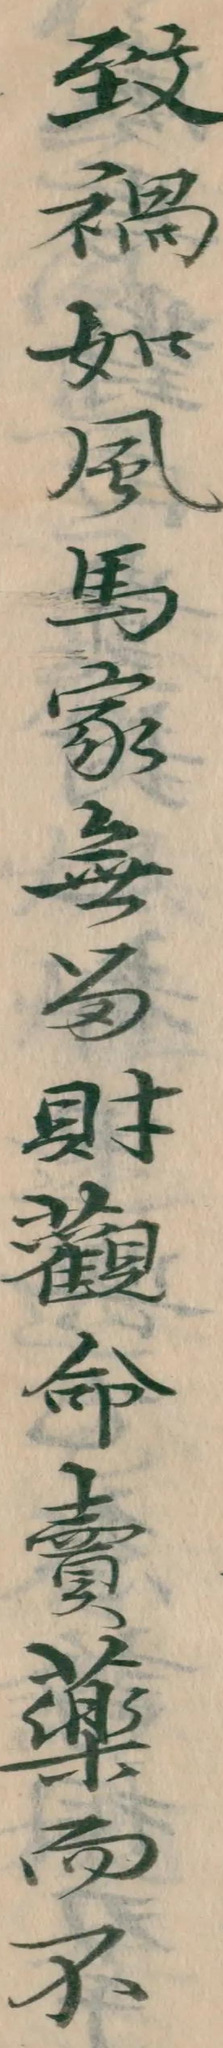致禍如風馬家無留財観命売薬而不
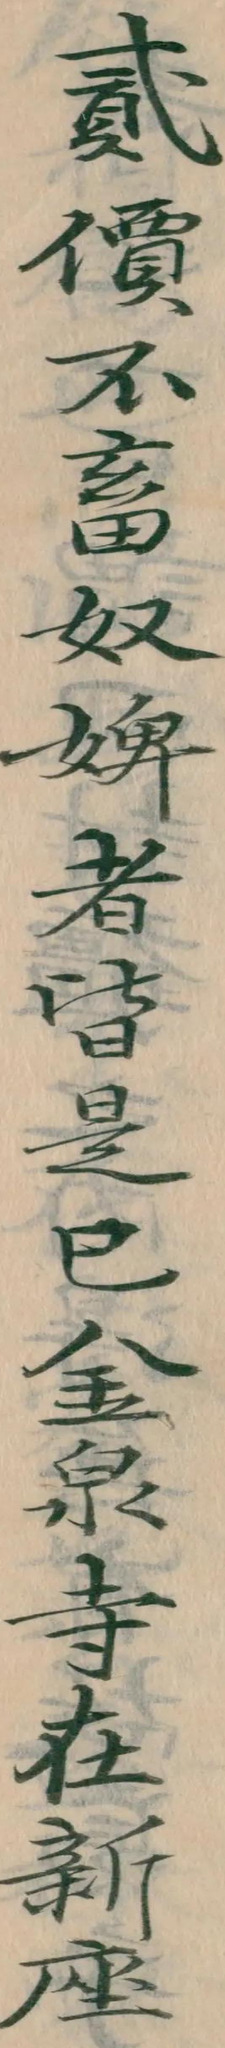弐価不畜奴婢者皆是巳金泉寺在新座
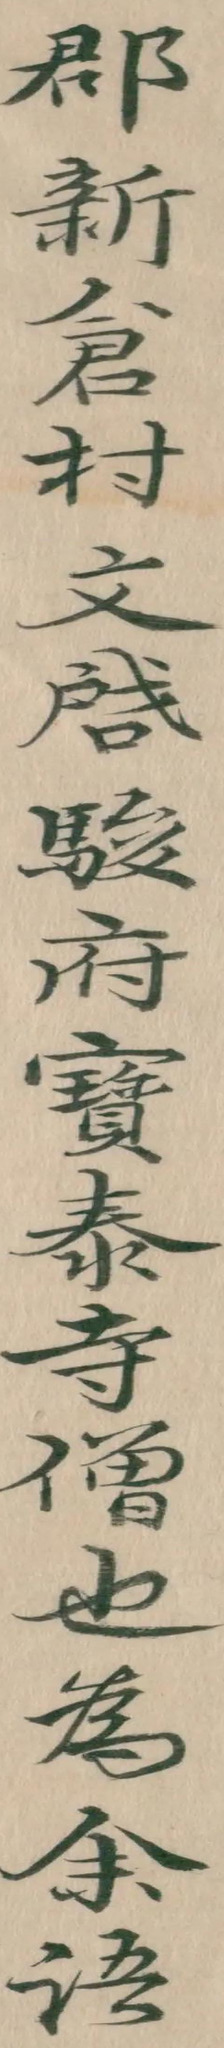郡新倉村文啔駿府宝泰寺僧也為余語如此
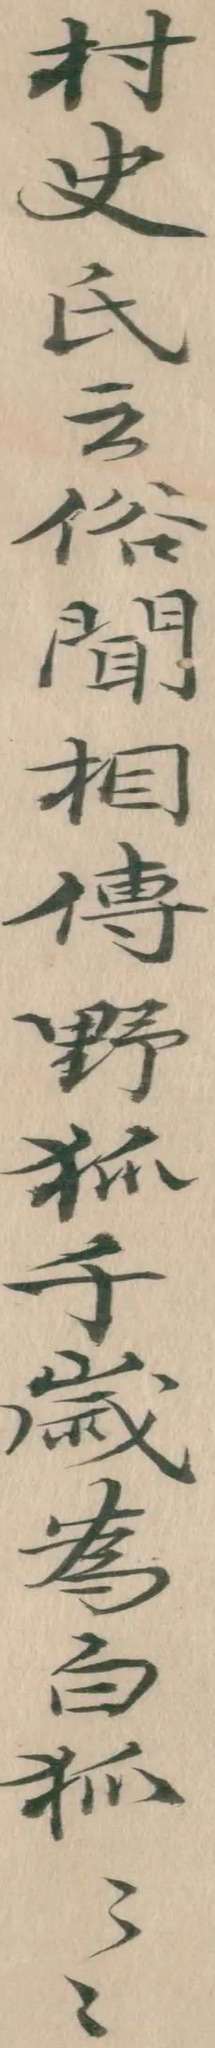村史氏云俗聞相伝野狐千歳為白狐云云
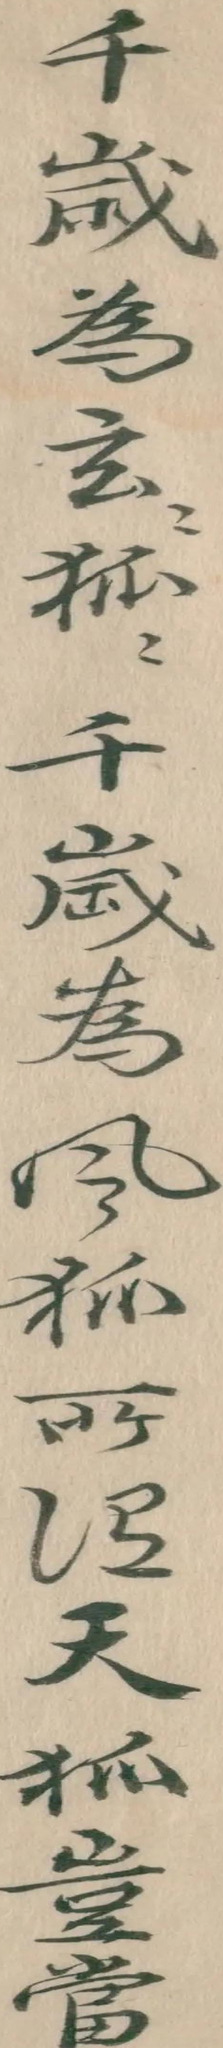千歳為玄々狐々千歳為風狐所天狐豈当
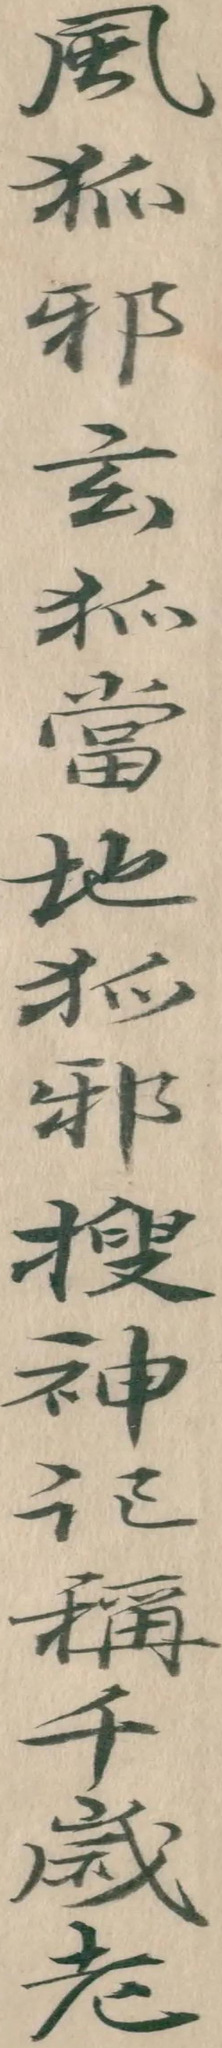狐邪玄狐当地狐邪捜神記称千歳老
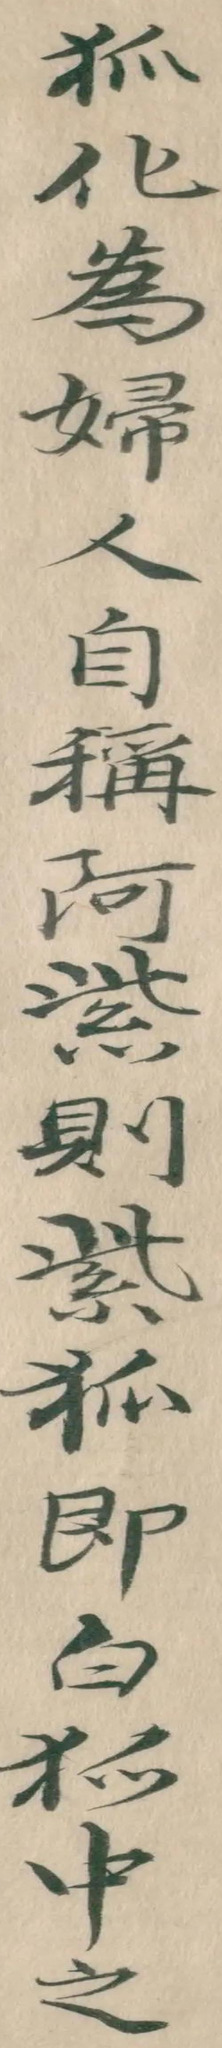狐化為婦人自称阿紫則紫狐即白狐中之
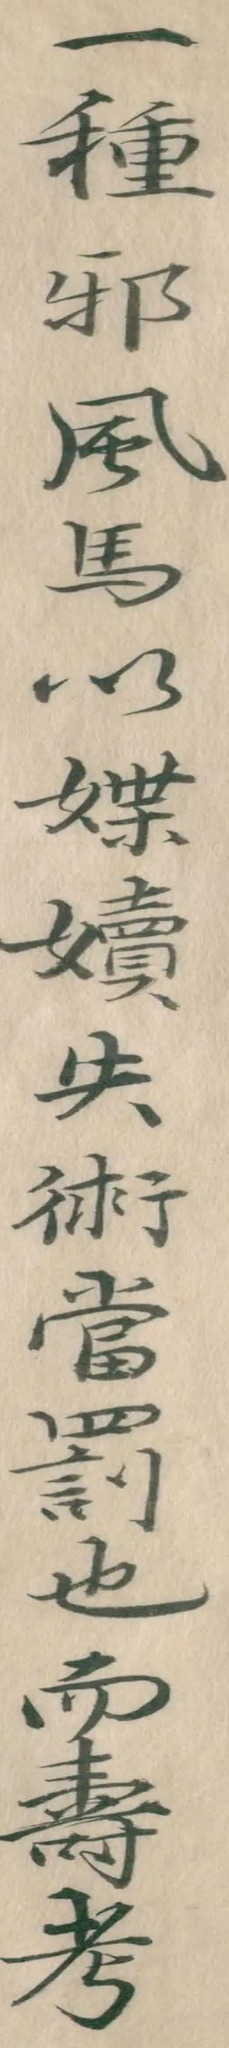一種邪風馬以媟嬻失術当罰也而寿考
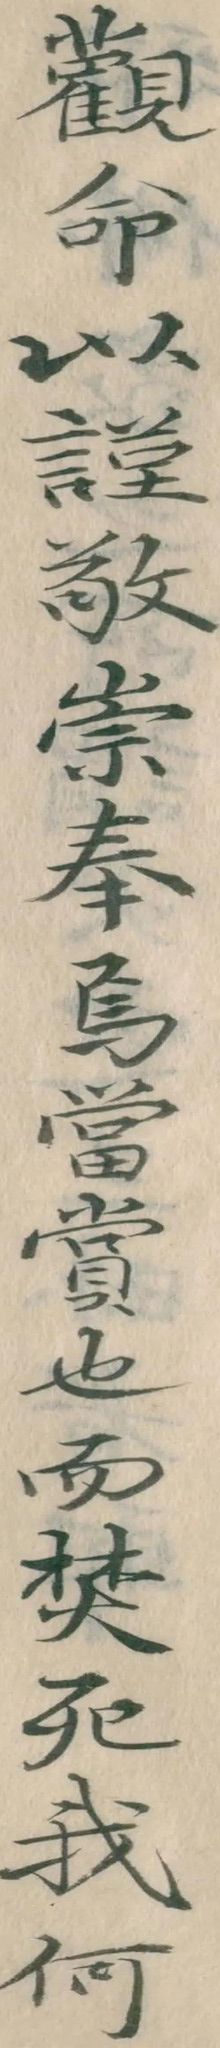観命以謹敬崇奉焉当賞也而焚死我何
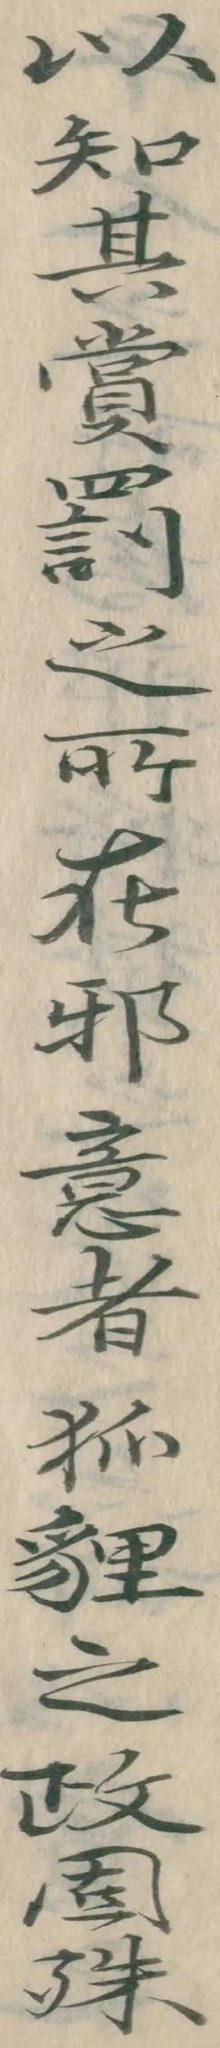以知其賞罰之所在邪意者狐狸之政固殊

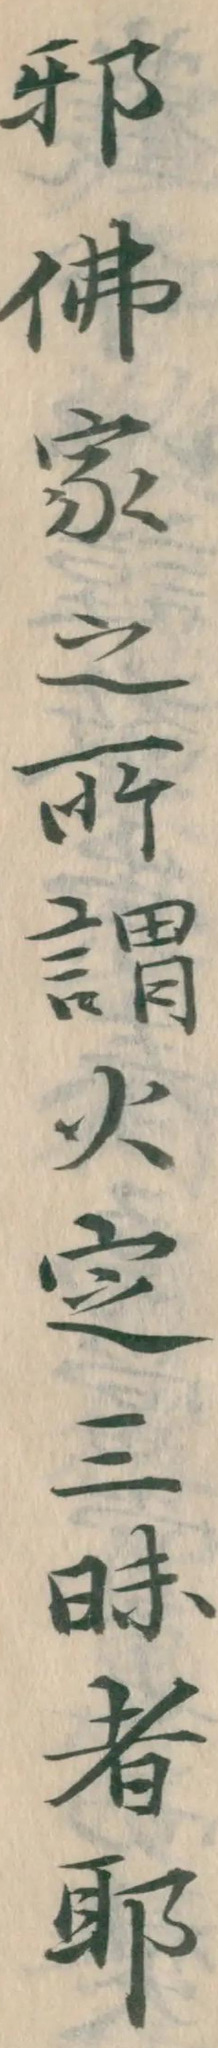邪仏家之所謂火定三昧者耶
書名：輪池叢書. 12
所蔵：国立国会図書館 National Diet Library, JAPAN
